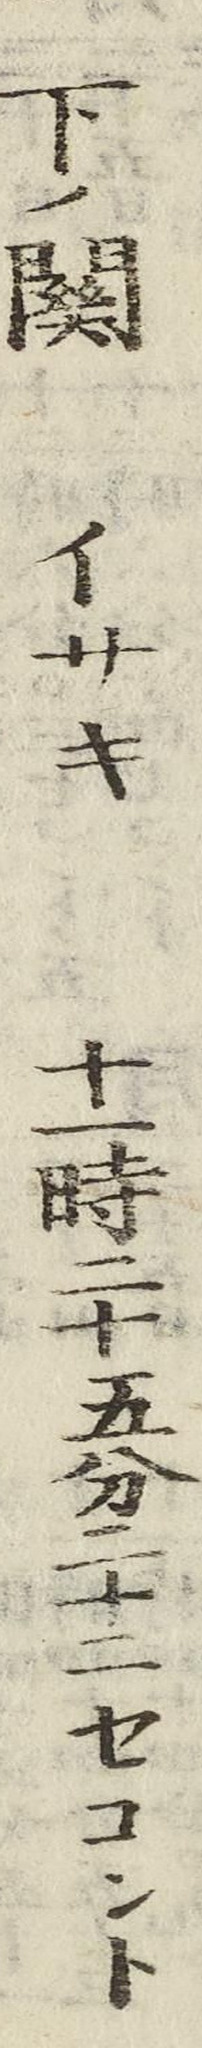下ノ関イサキ十一時二十五分二十二セコント
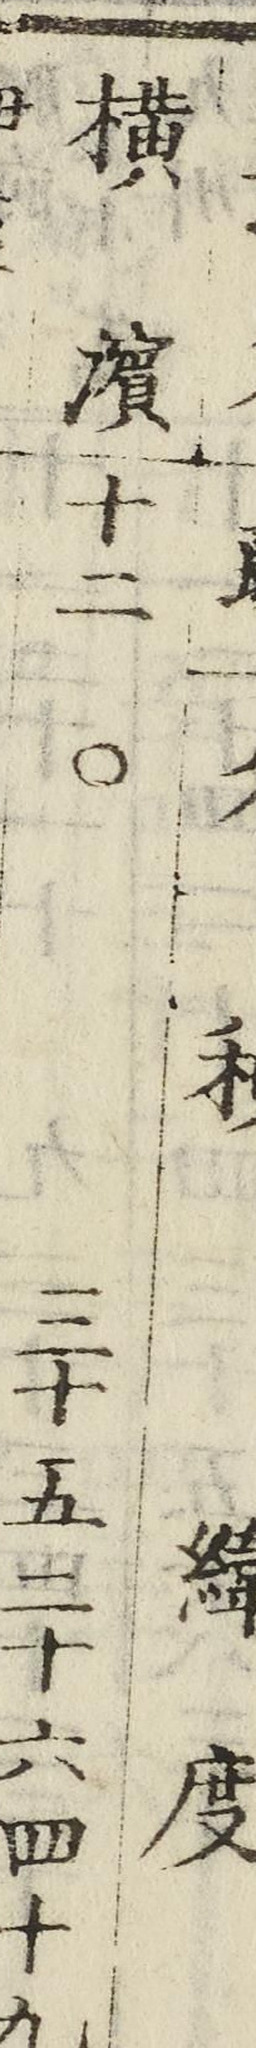横浜十二〇三十五二十六四十九
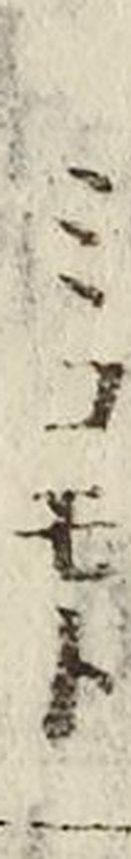ミコモト
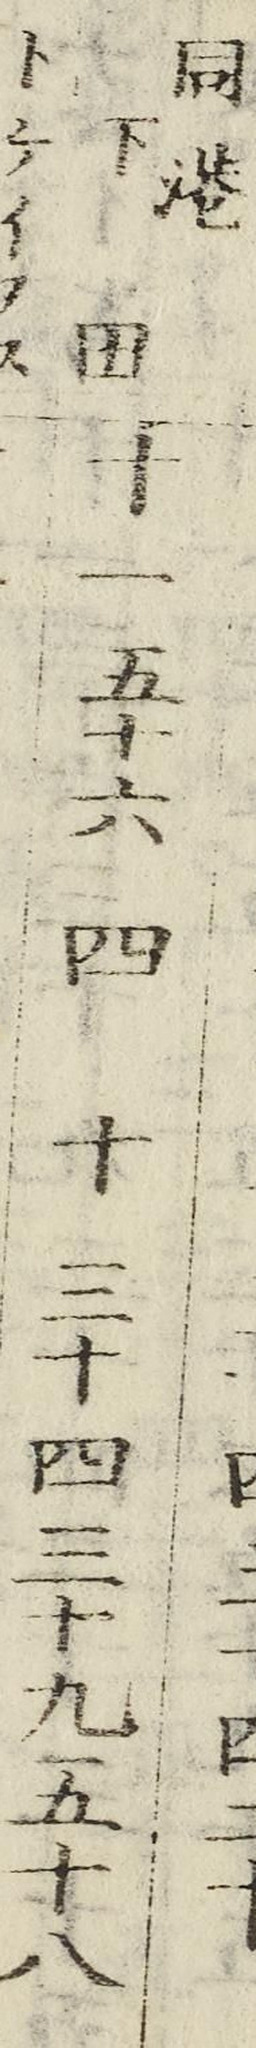同港十一五十六四十三十四三十九五十八
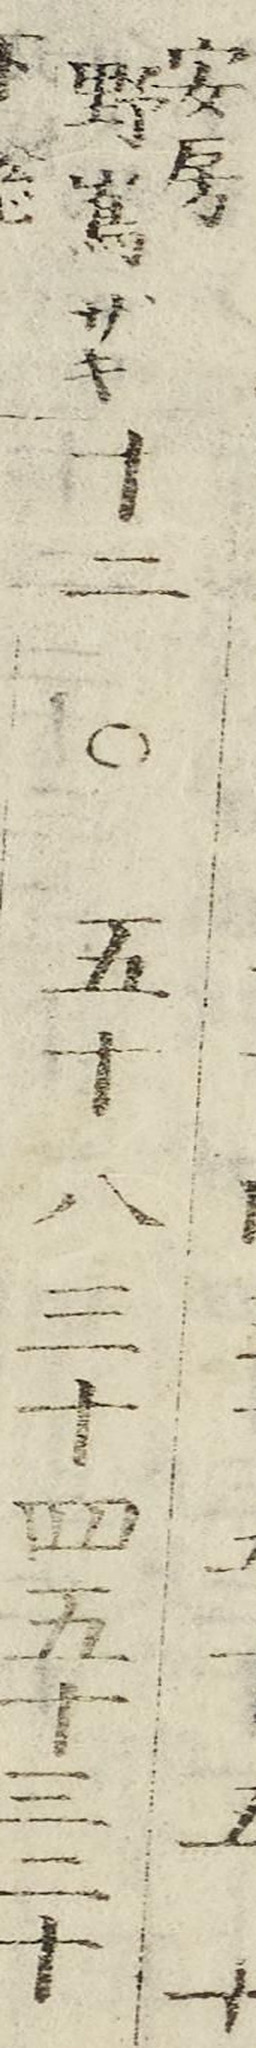安房十二〇五十八三十四五十三二十

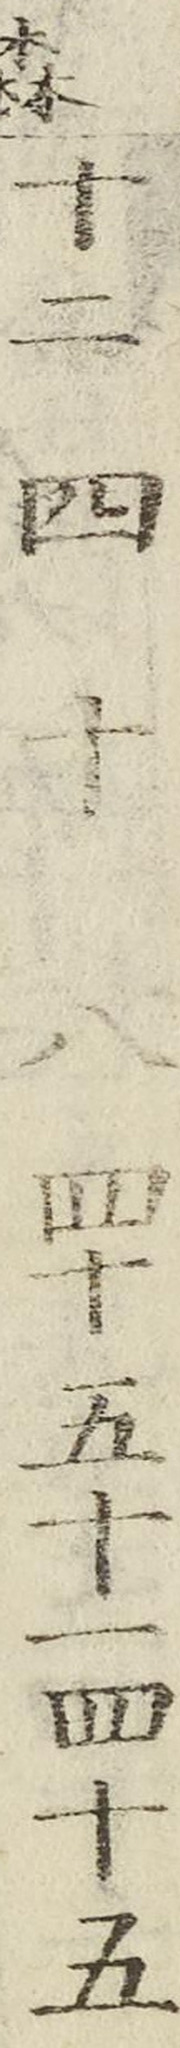奥州十二四十八四十五十一四十五
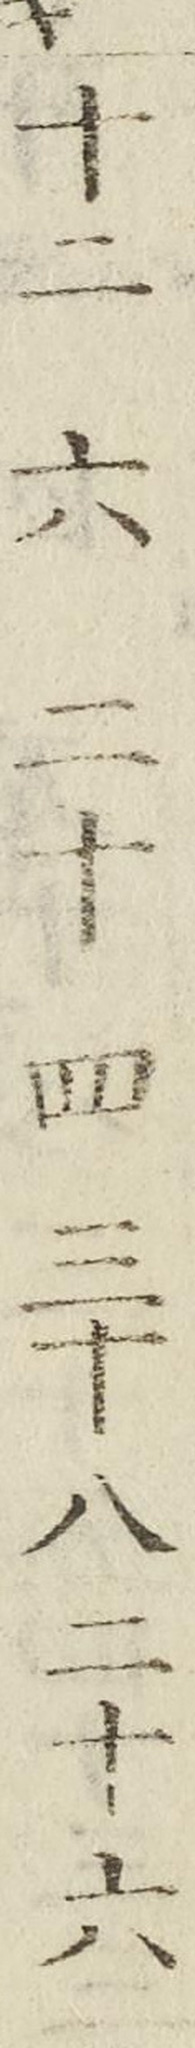陸前十二六二十四三十八二十六
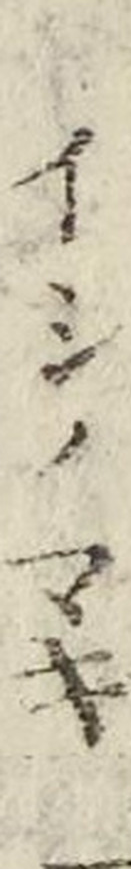イシノマキ
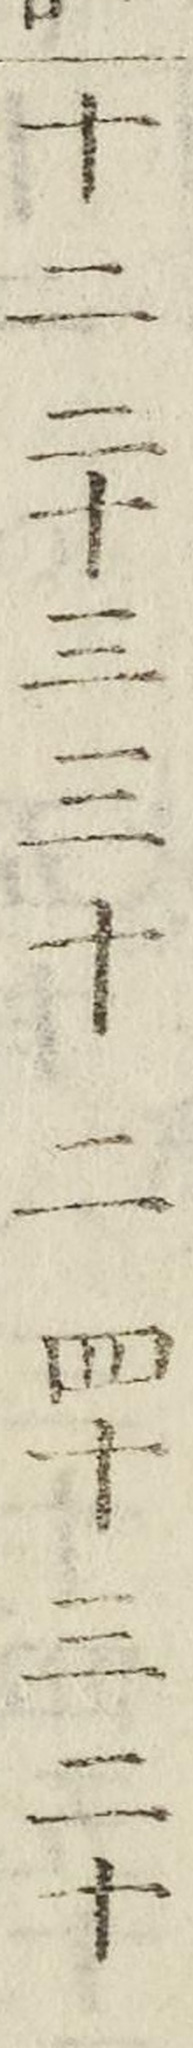北国十二二十三三十二四十三二十
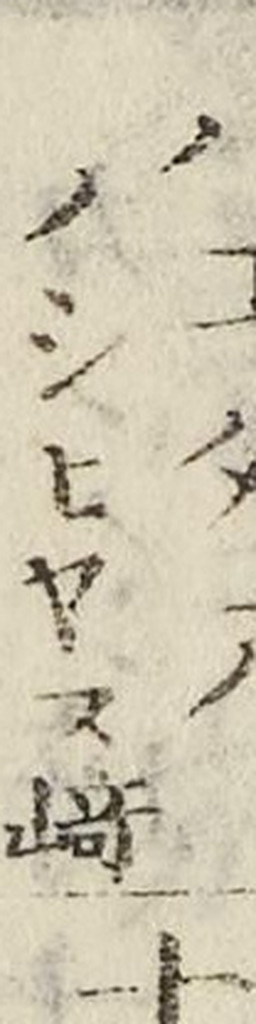ノシヒヤス崎
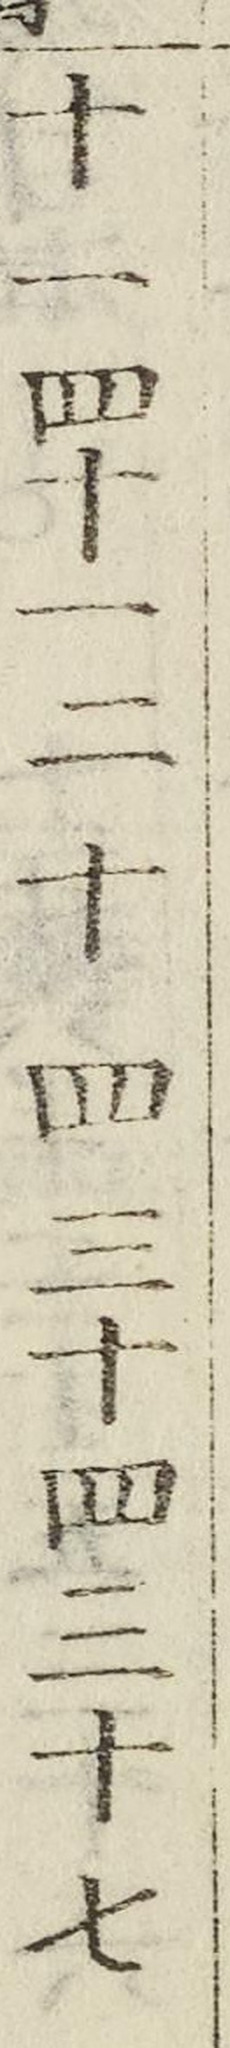阿波十一四十一二十四三十四三十七
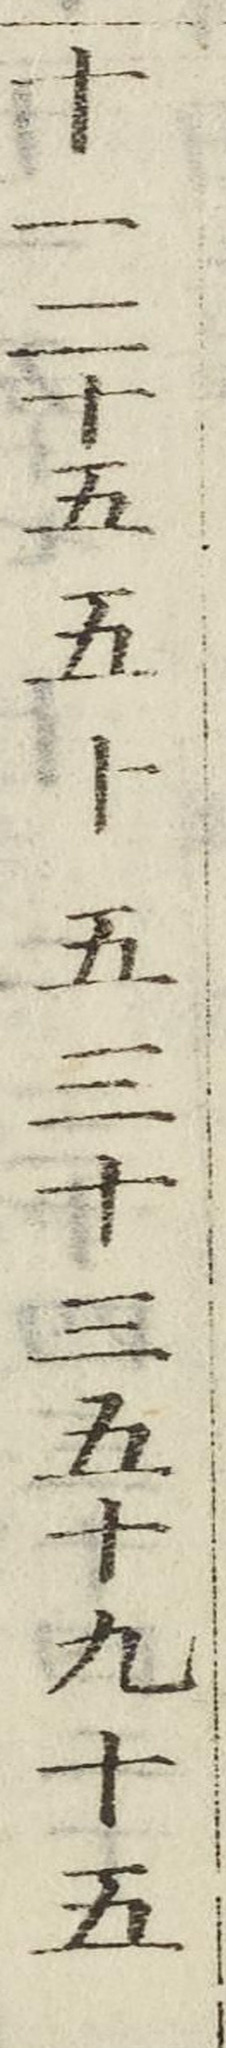長門十一二十五五十五三十三五十九十五
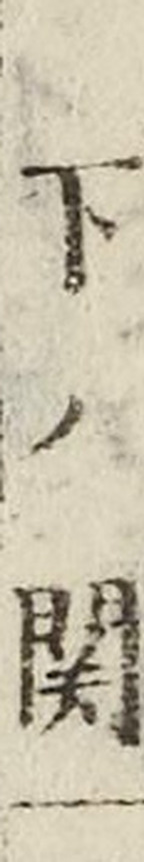下ノ関
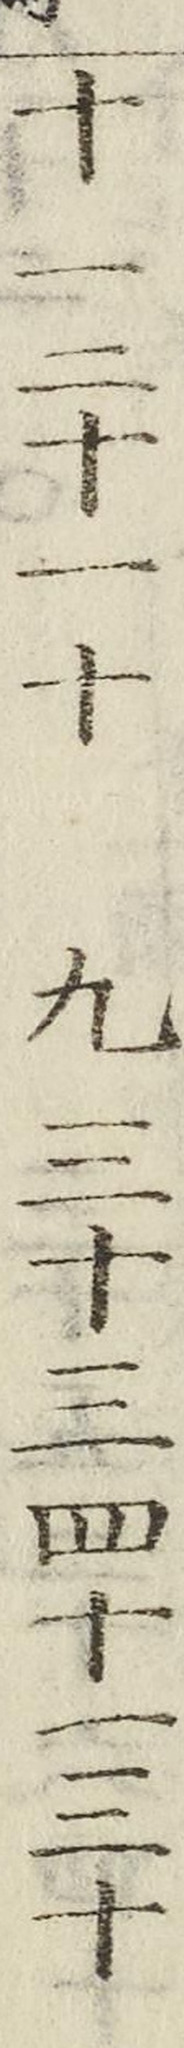肥前十一二十一十九三十三四十一三十
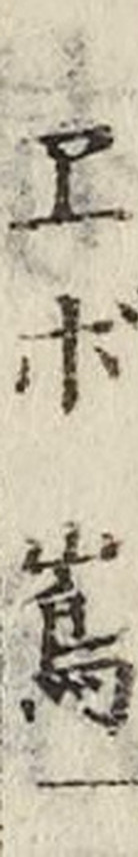ヱボ嶋
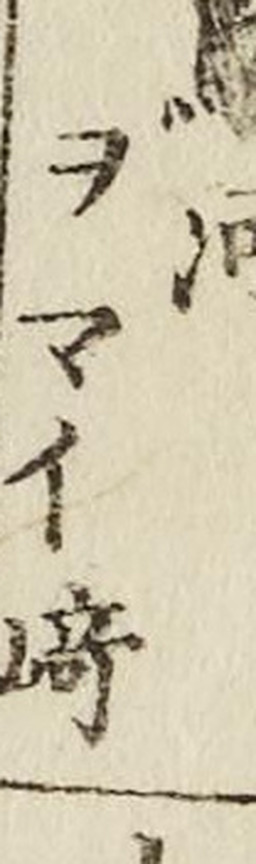ヲマイ崎
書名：[時計に関する冊子]
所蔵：東京大学地震研究所図書室 Earthquake Research Institute Library, The University of Tokyo, JAPAN
